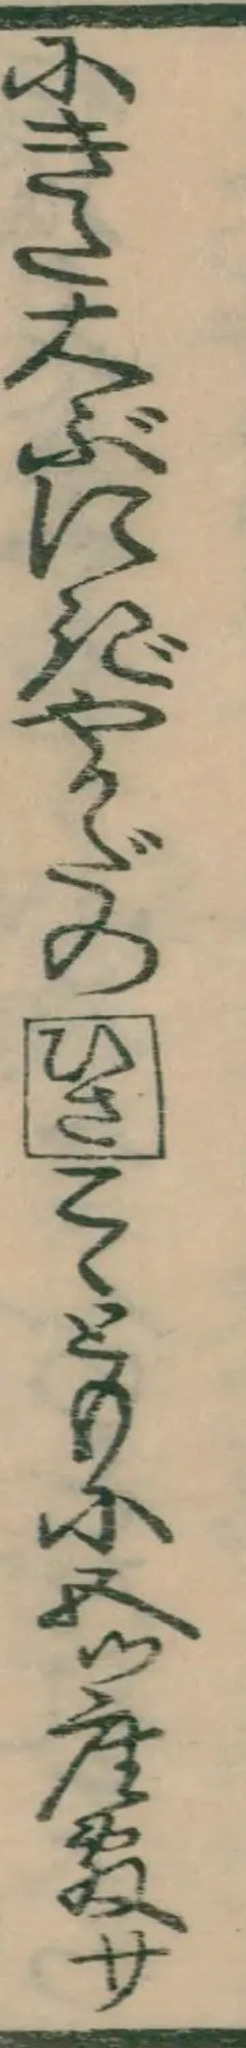にきた大ぶぎやかだの〈ひさ〉こゝともに五つ座敷サ
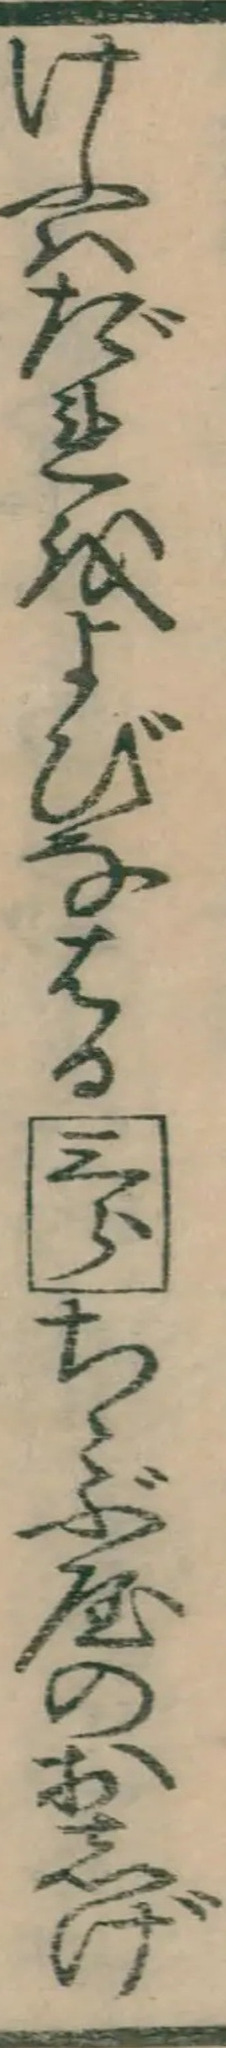けふはだれをよびなはる〈三郎〉ちゝぶ屋のおしげ
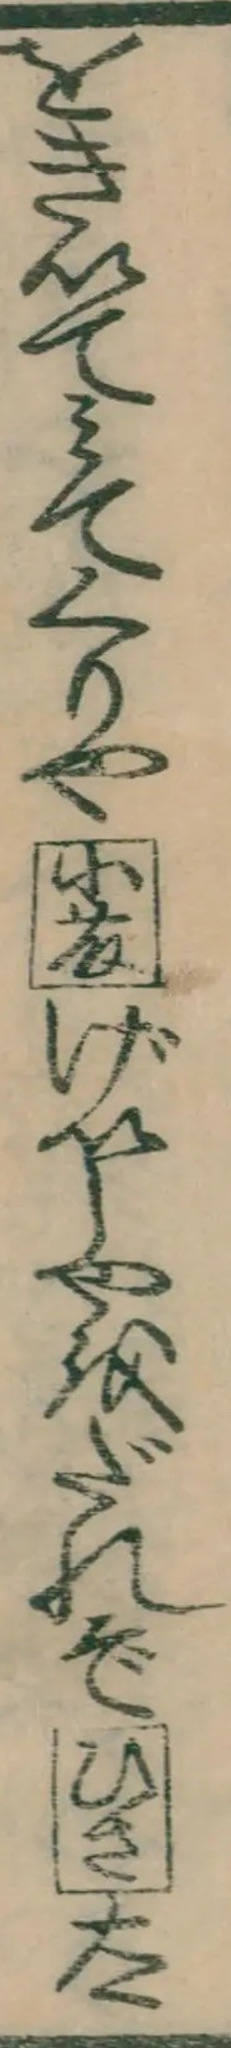をきいてみてくりや〈小藤〉げいしやをだれぞ〈ひさ〉太

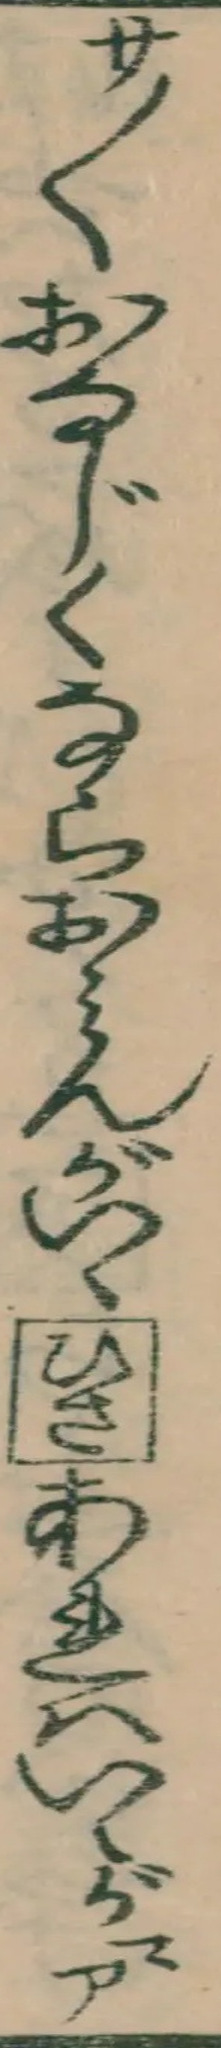サ〳〵おなじくならおみんがいゝ〈ひさ〉あれはいゝがマァ
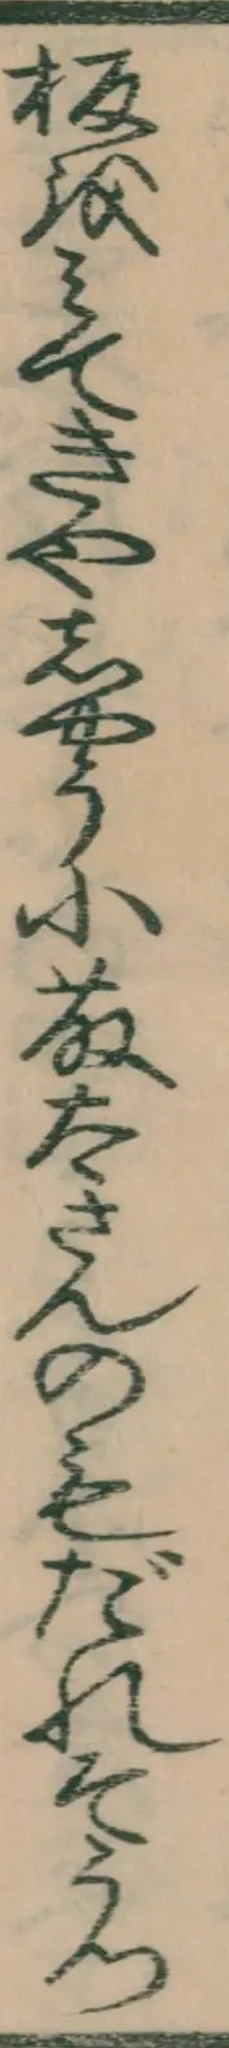板をみてきやしやう小藤太さんのもだれそうつ
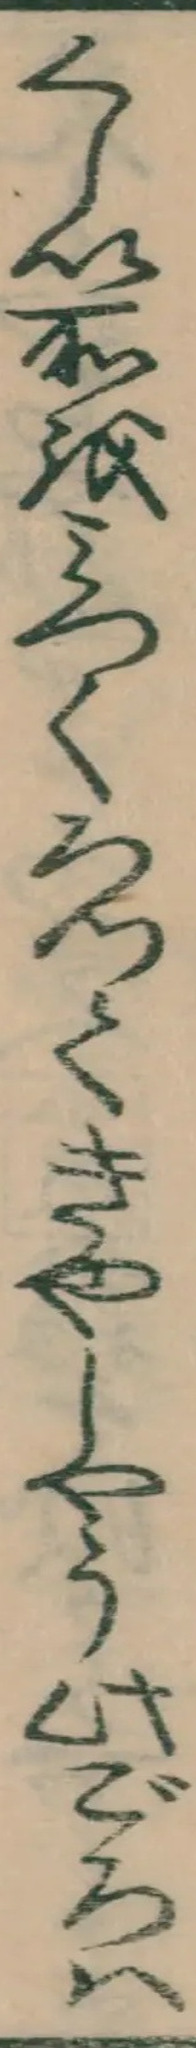くしい所をみつくろつてきやしやう此ごろは
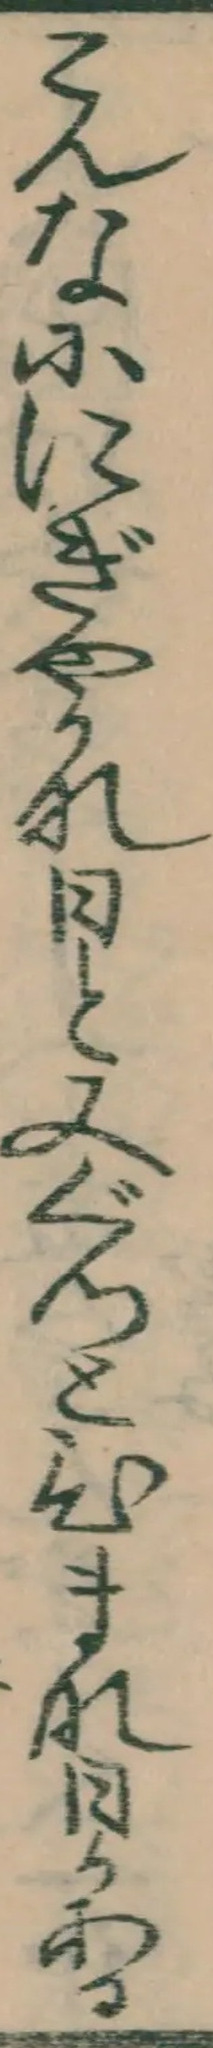こんなにぎやかな日と又ぐつとひまな日かある
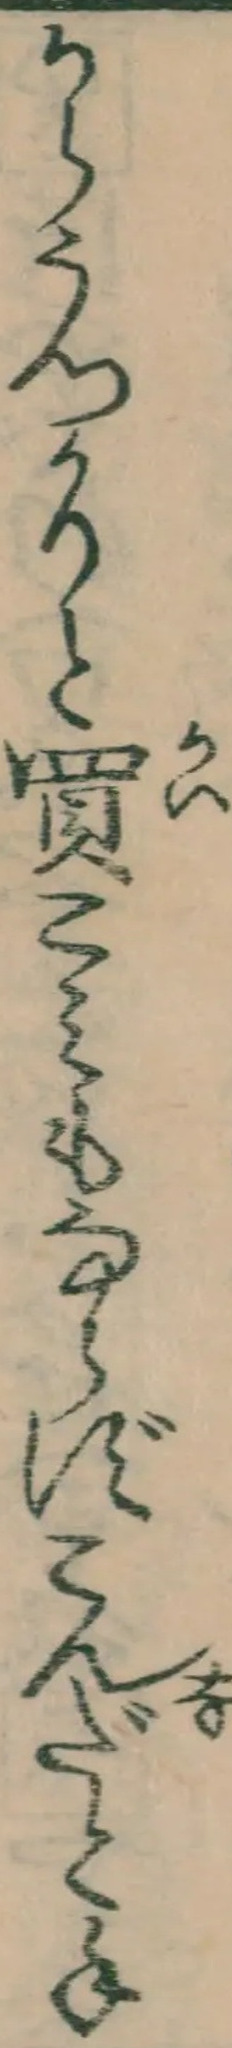からうつかりと買こみもならずこんなだと手
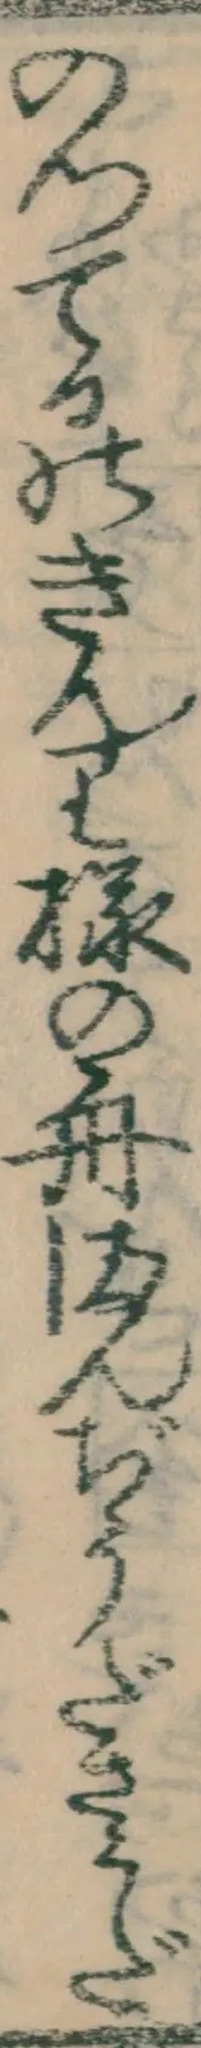のつてるのきんり様の舟まんぢうださうだ
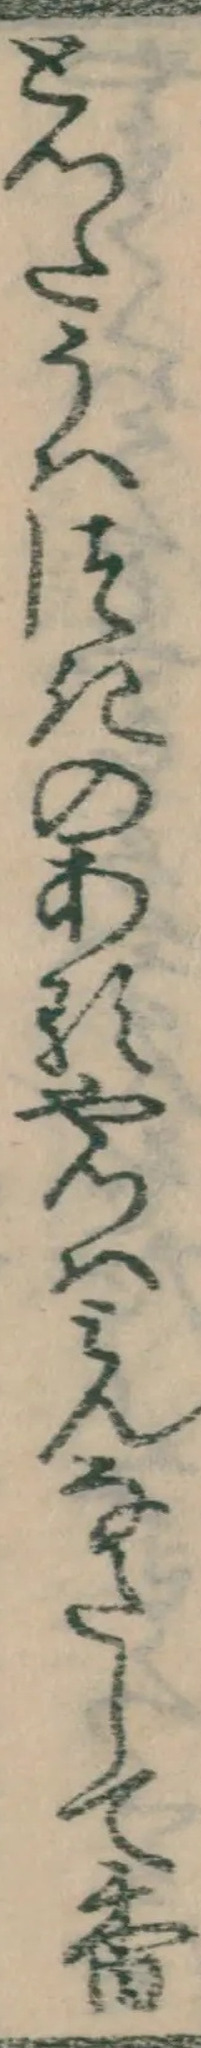とつたうはつきのあるやつはみんなたして香
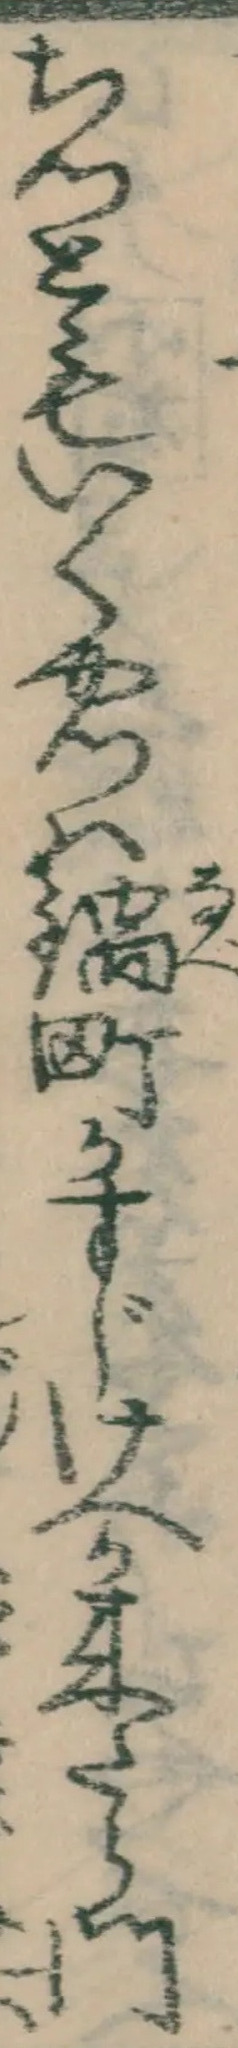ちつともいくやつは鍋町かすじけへか来たら門

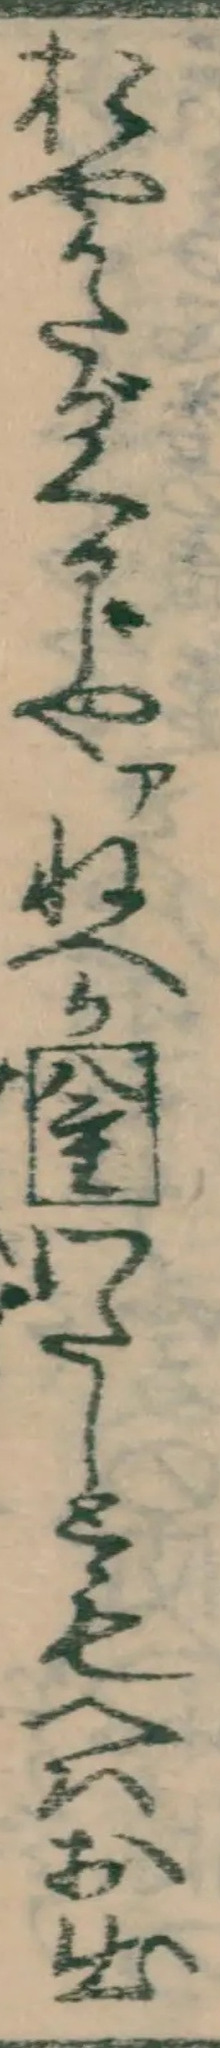おやかたがくるじやァねへか〈八重〉わたしともへはお出
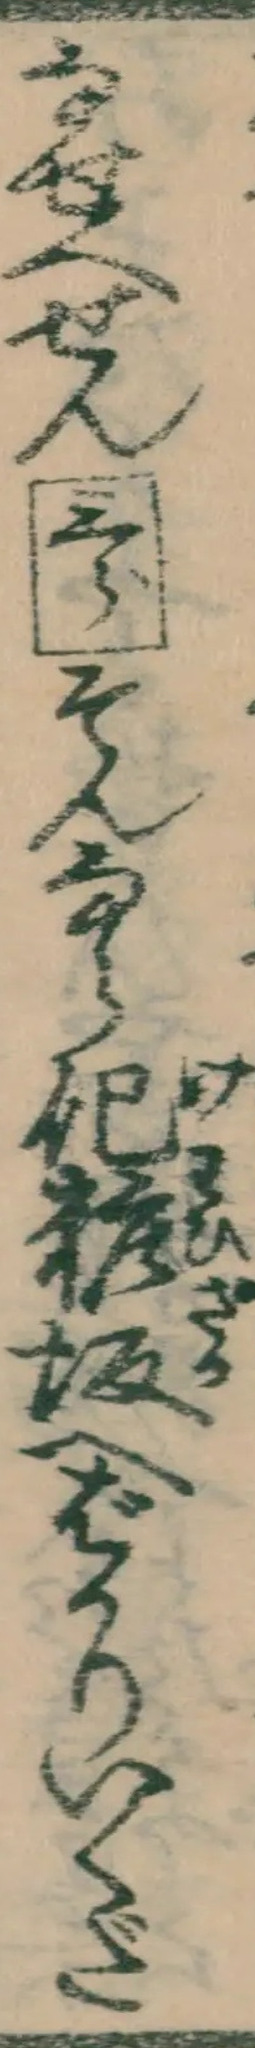なせへせん〈三郎〉そんなら化粧坂へばかりいくだ
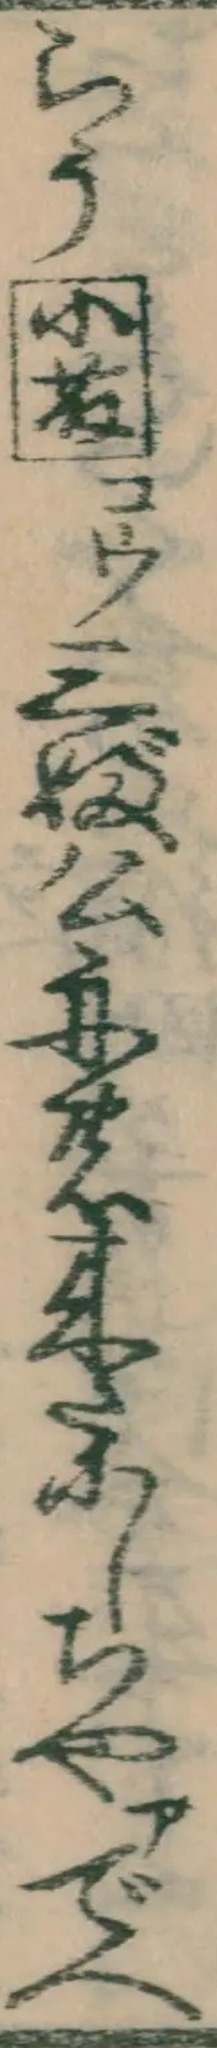らう〈小藤〉コウ三ぶ公舟の来たにしちやァでへ
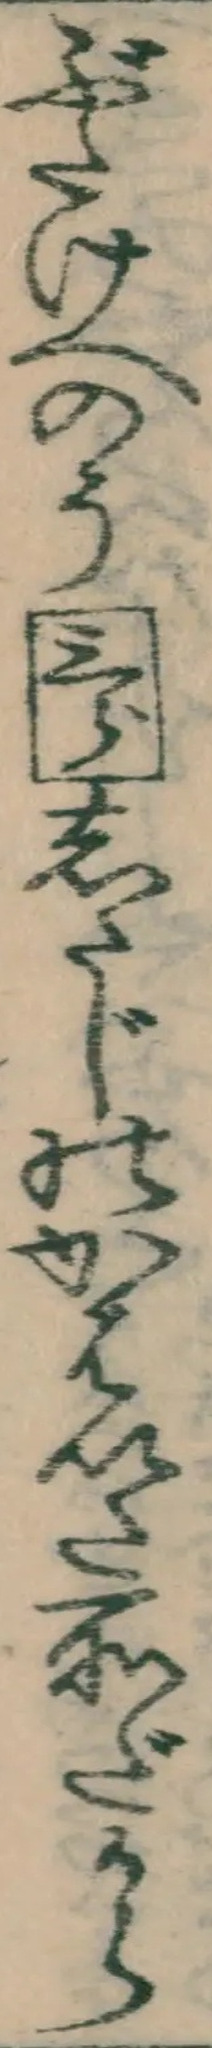ぶたけへのう〈三郎〉したじのかはいた所だから
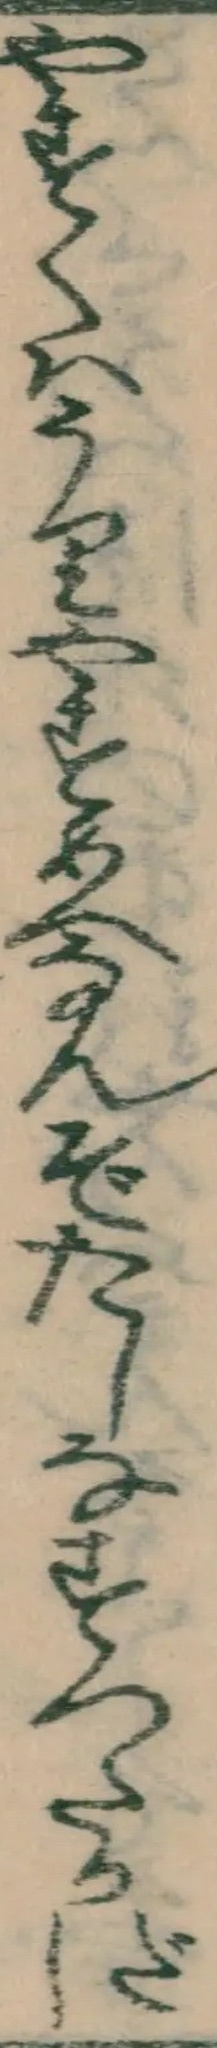やすくはうりやすめへなんぞたしなすつたかだし
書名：教訓読本：大礒風俗仕懸文庫
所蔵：国立国会図書館 National Diet Library, JAPAN
